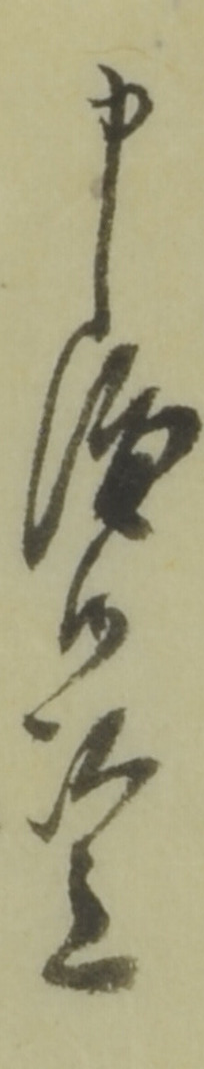申渡候以上
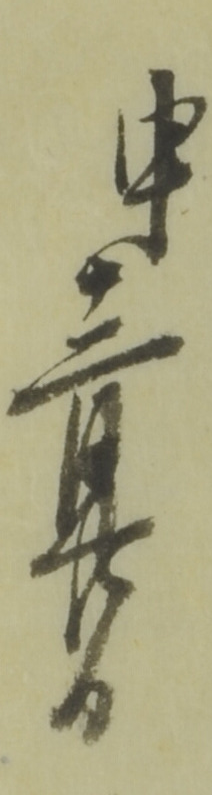申十二月廿日

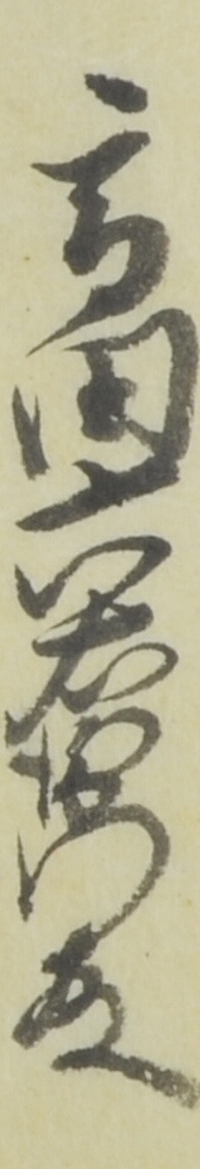高田六右衛門殿
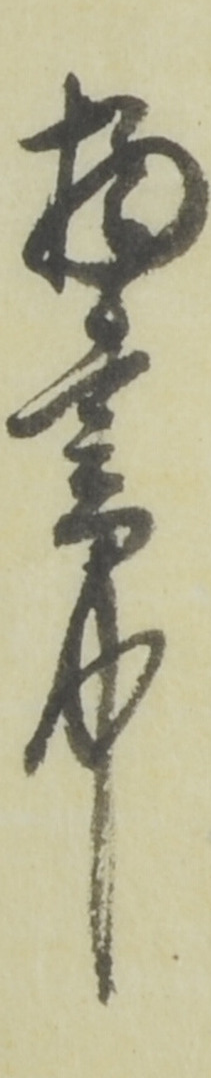物書中
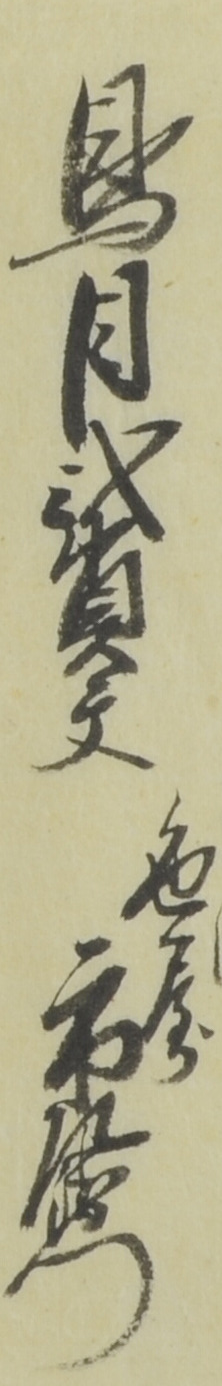鳥目弐貫文市左衛門
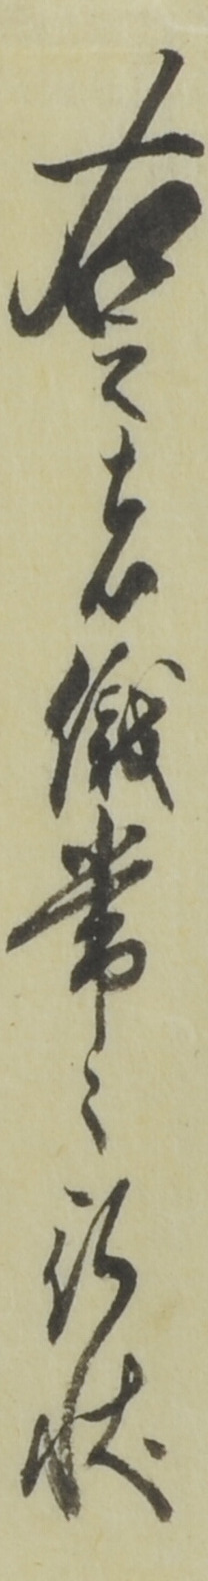右之者儀常々行状
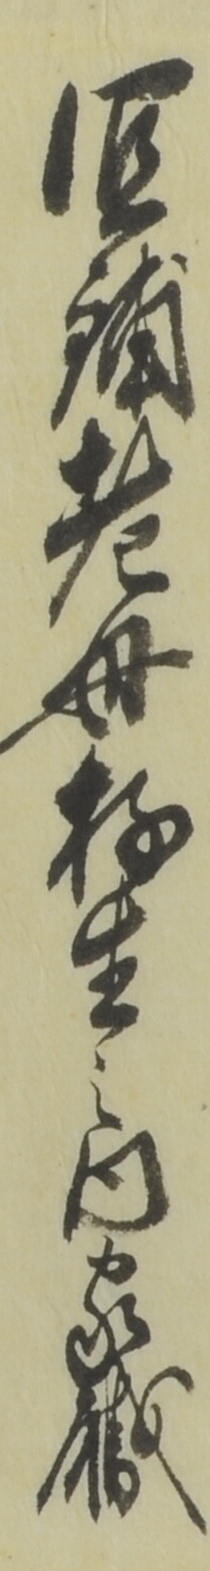宜鋪老母存生之内家職
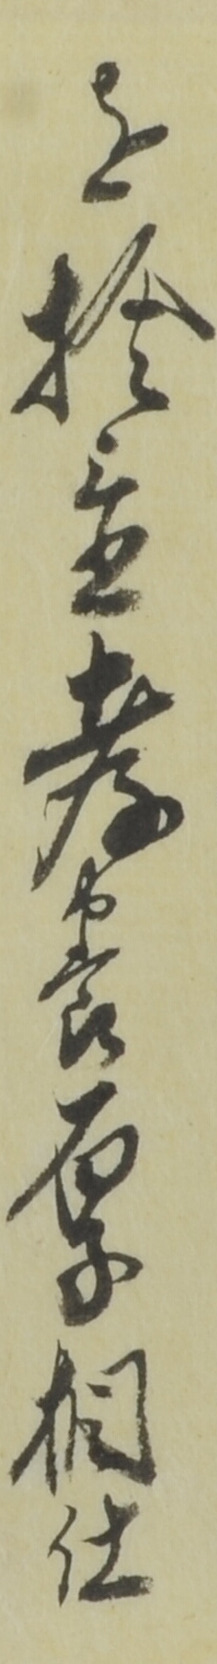を捨置孝養厚相仕
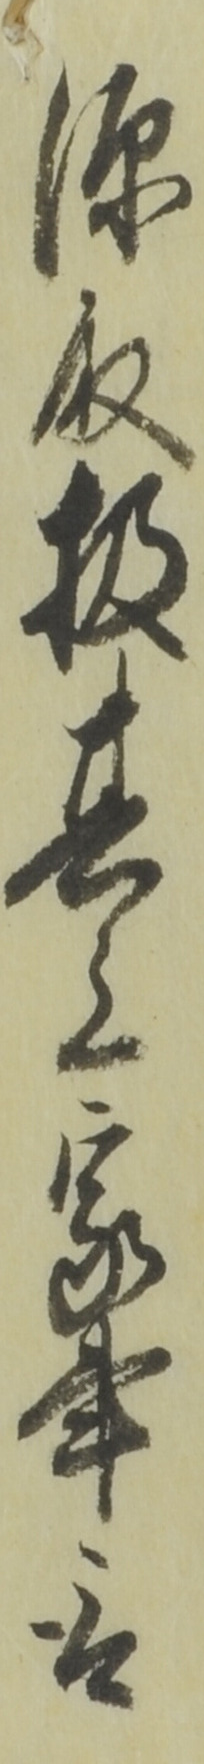深取扱其上家事取
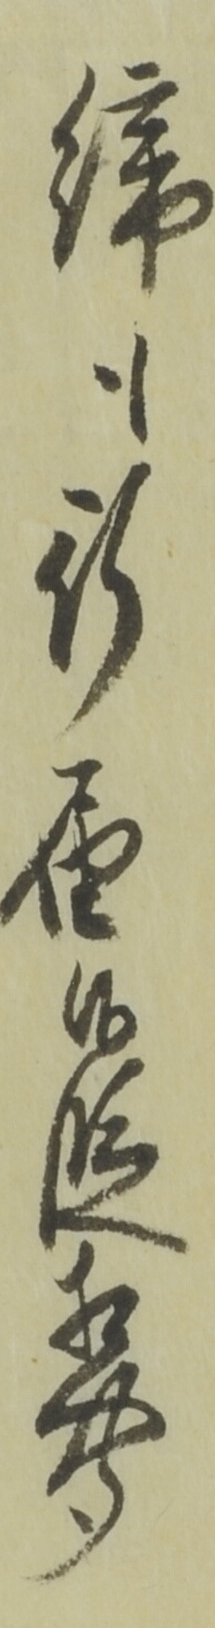締も行届候段相聞
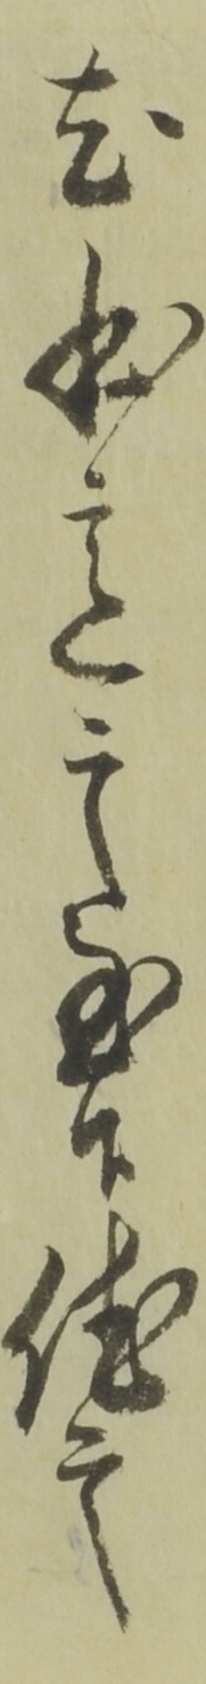尤本意之至候依之
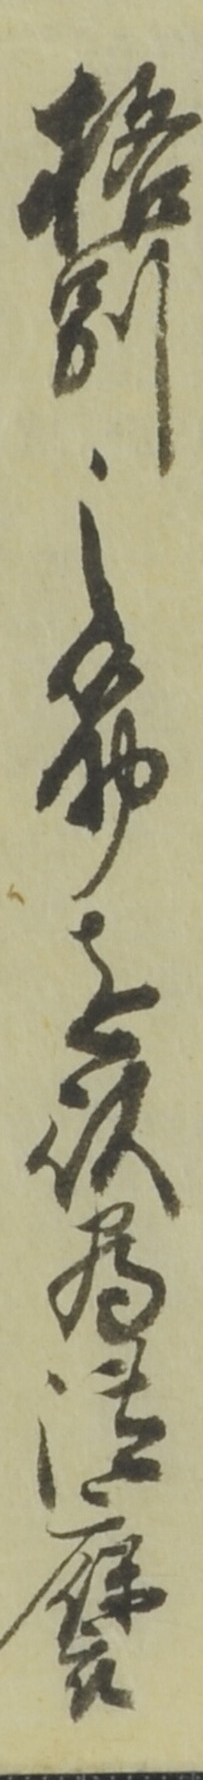格別之筋を以為御褒
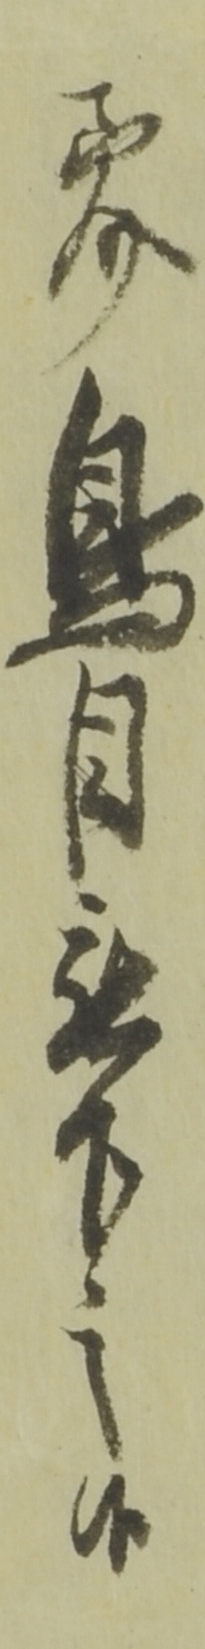美鳥目被下之候
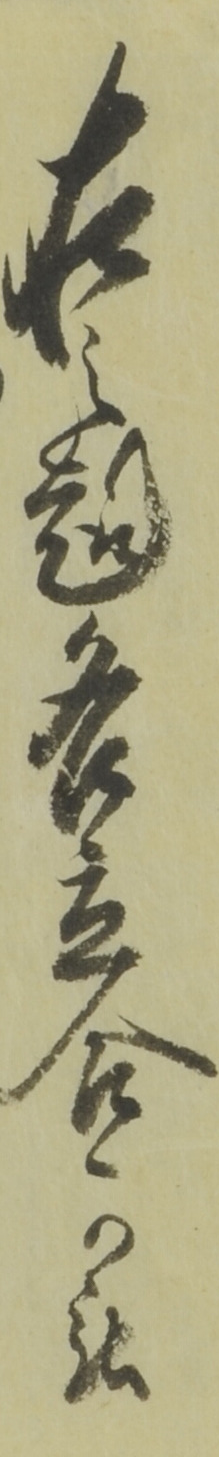右之趣各立合可被
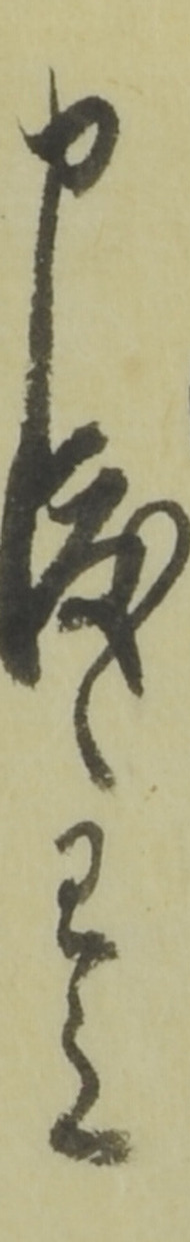申渡候已上
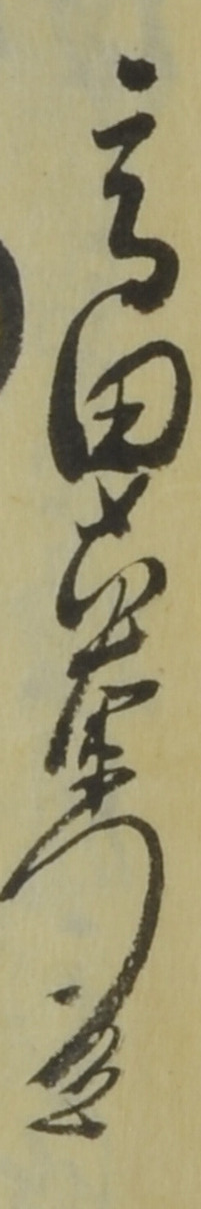高田六右衛門殿
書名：御触書御書附控
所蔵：伊那市立高遠町図書館・合同会社AMANE
